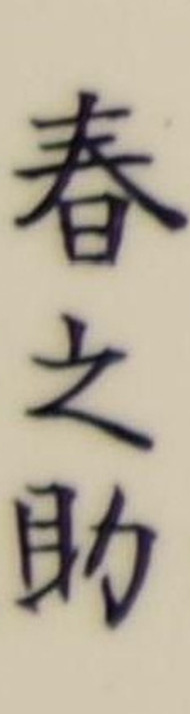春之助
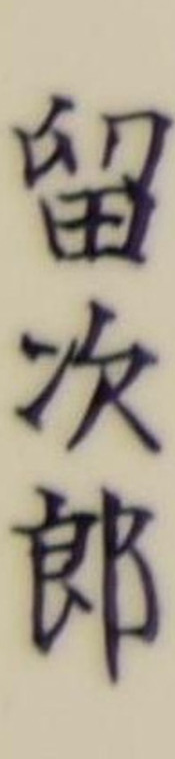留次郎

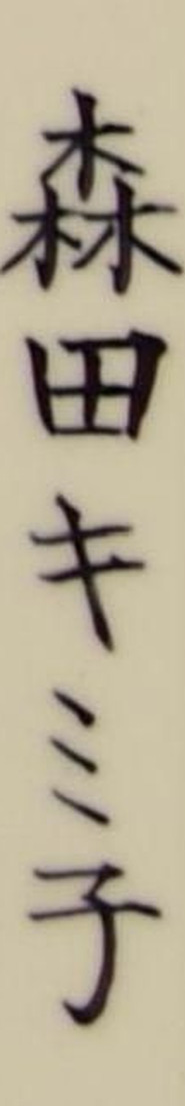森田キミ子
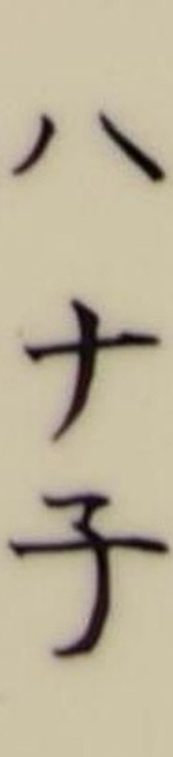ハナ子
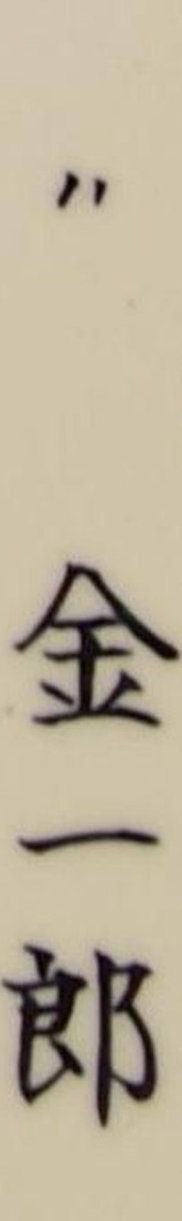金一郎
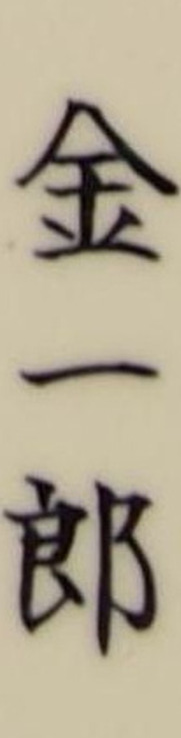金一郎
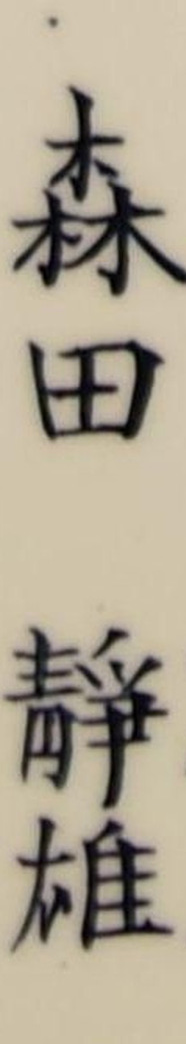森田静雄
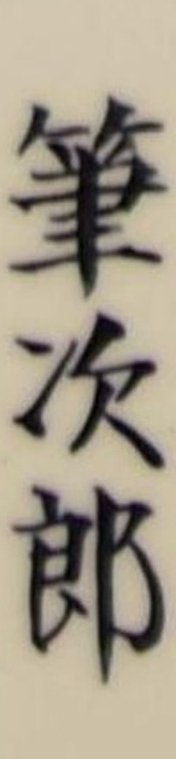筆次郎
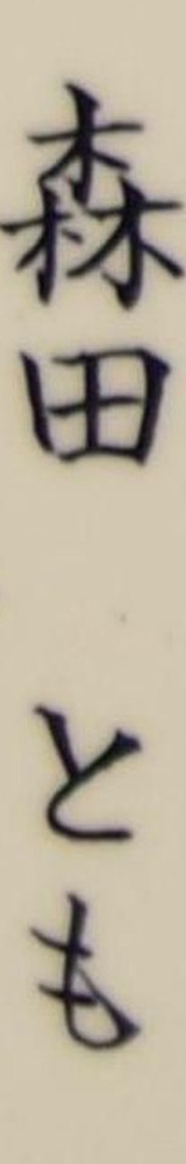森田とも
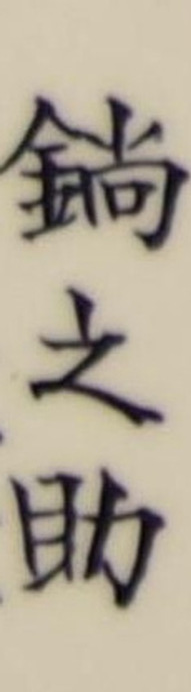鋿之助
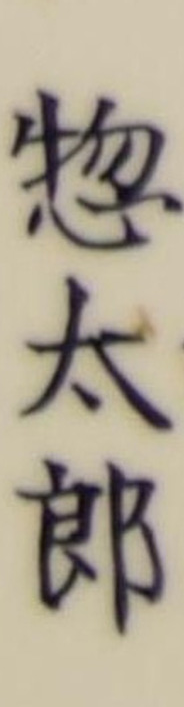惣太郎

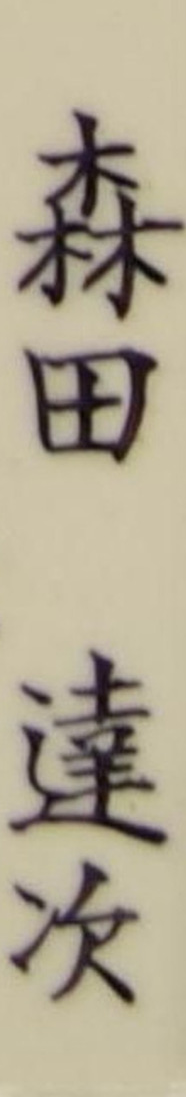森田達次
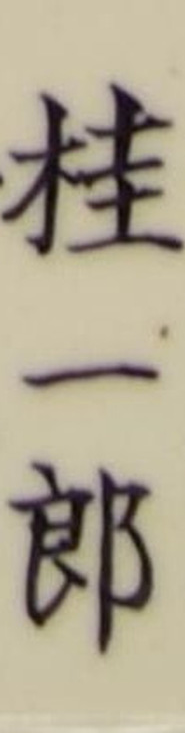桂一郎
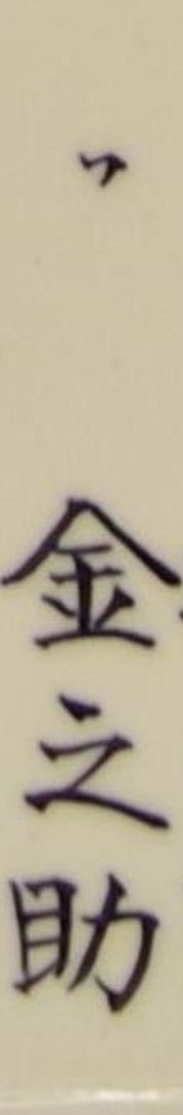金之助
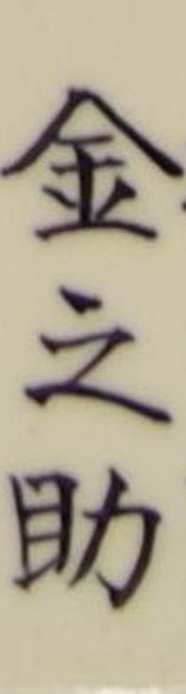金之助
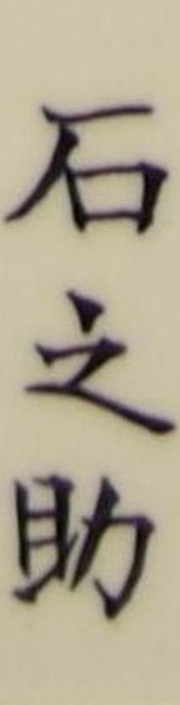石之助
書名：A~D
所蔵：koyasan kongobuji
